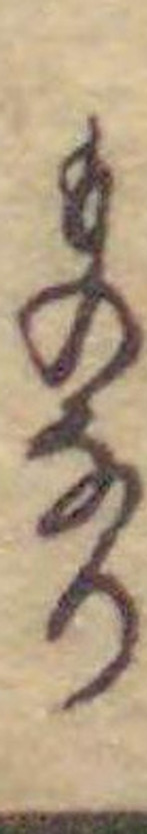ものなり
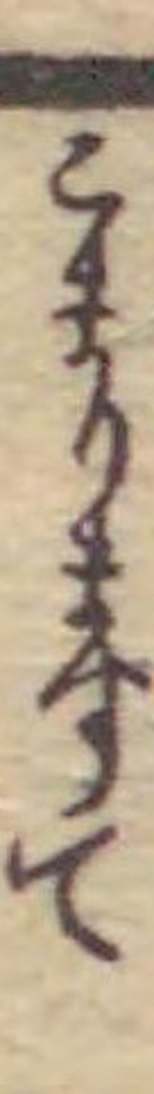こまりますて

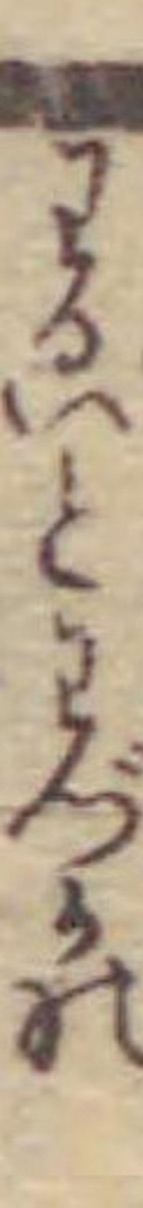わるいとわづかの
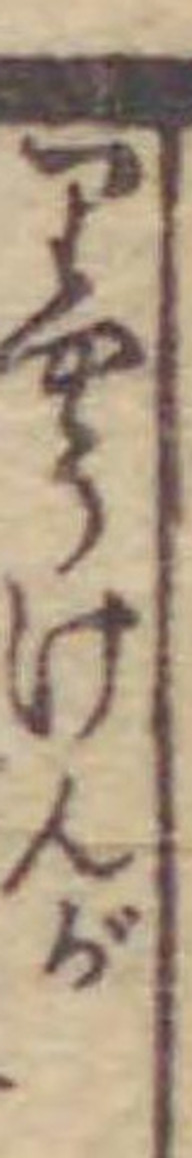りやうけんが
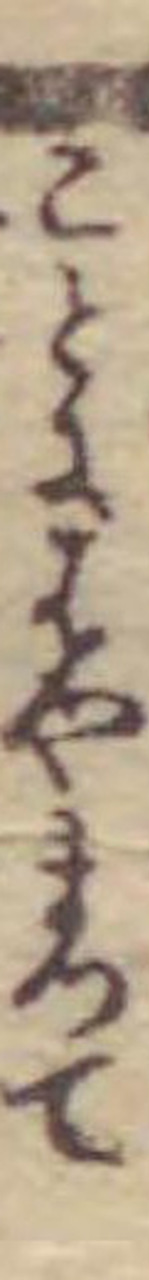ことにはやまつて
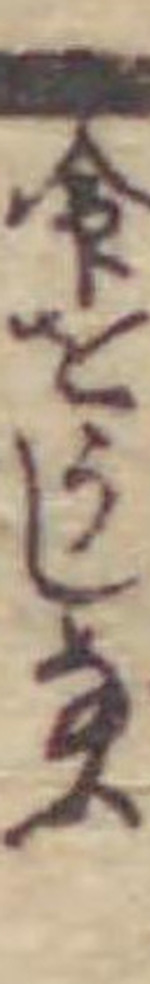命をうしなふ
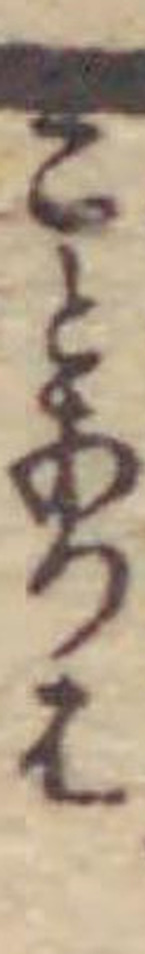ことありは
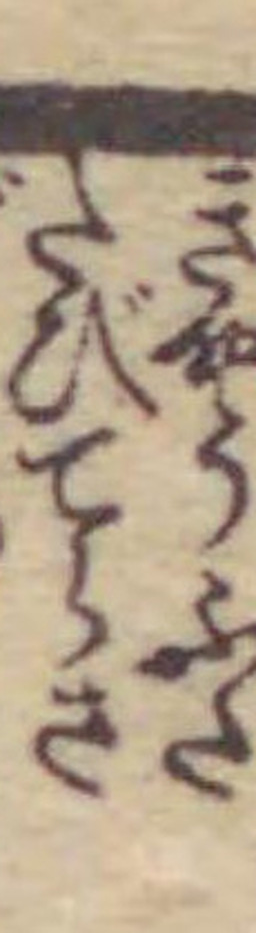たびてらさ
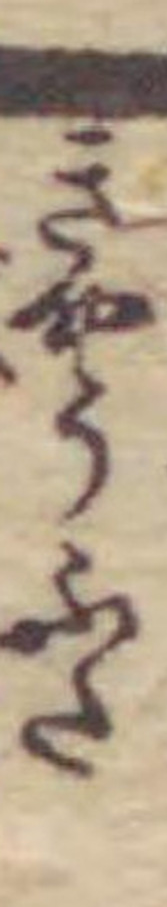きやうふた
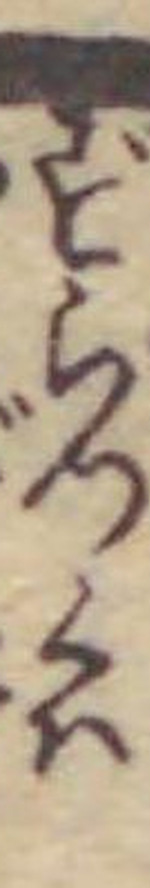ずらつくは
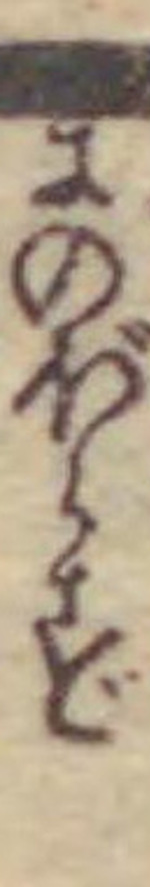にのぼらず
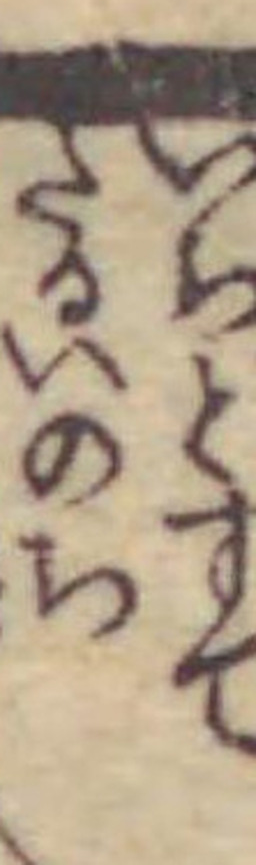たるいのち
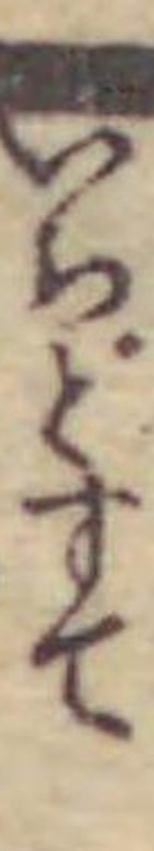いちどすて
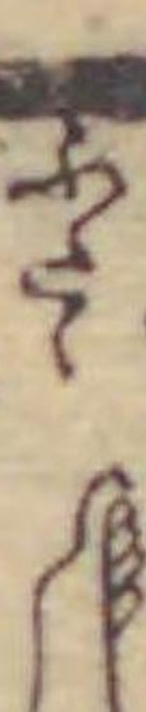ふたゝ
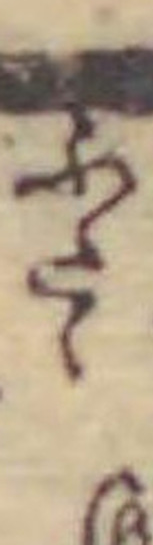ふたゝ
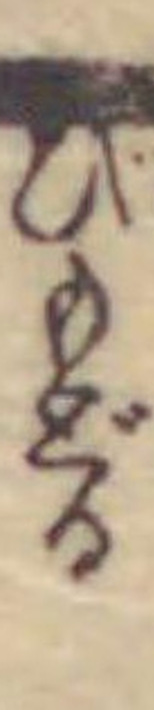びもどる
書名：御誂染長寿小紋 : 3巻
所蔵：国立国会図書館 National Diet Library, JAPAN
